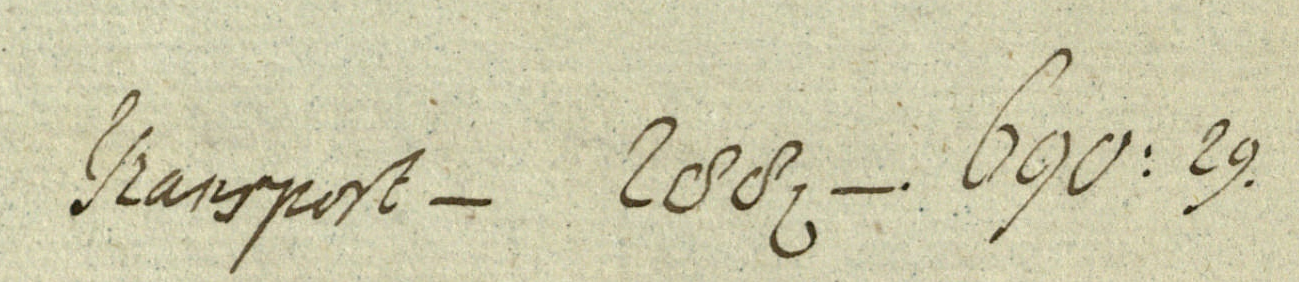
Transport 288. 690. 29.
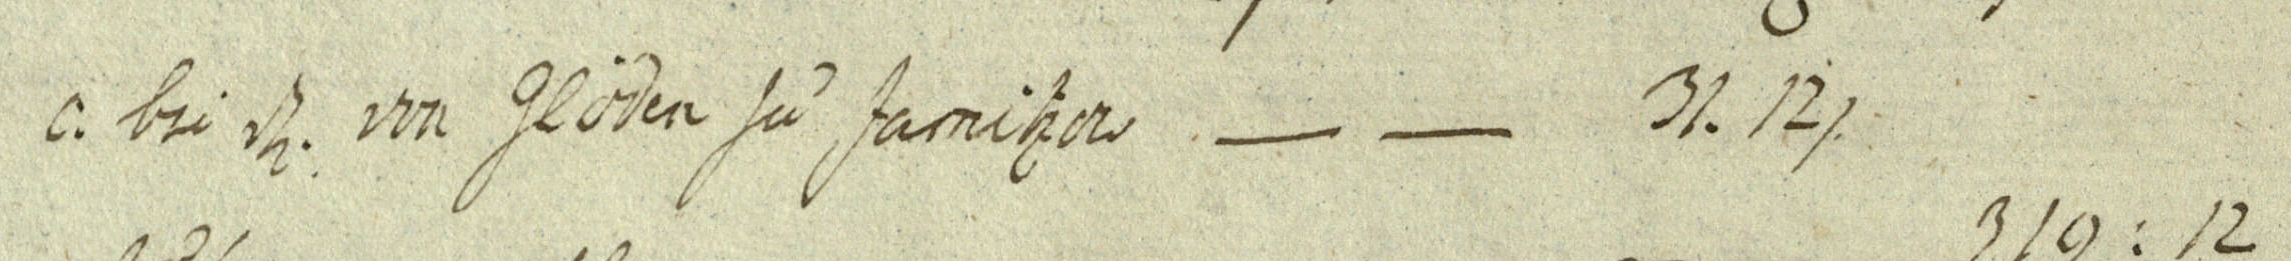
c. bei dh. von Glöden zu Jamitzow - 31. 12,
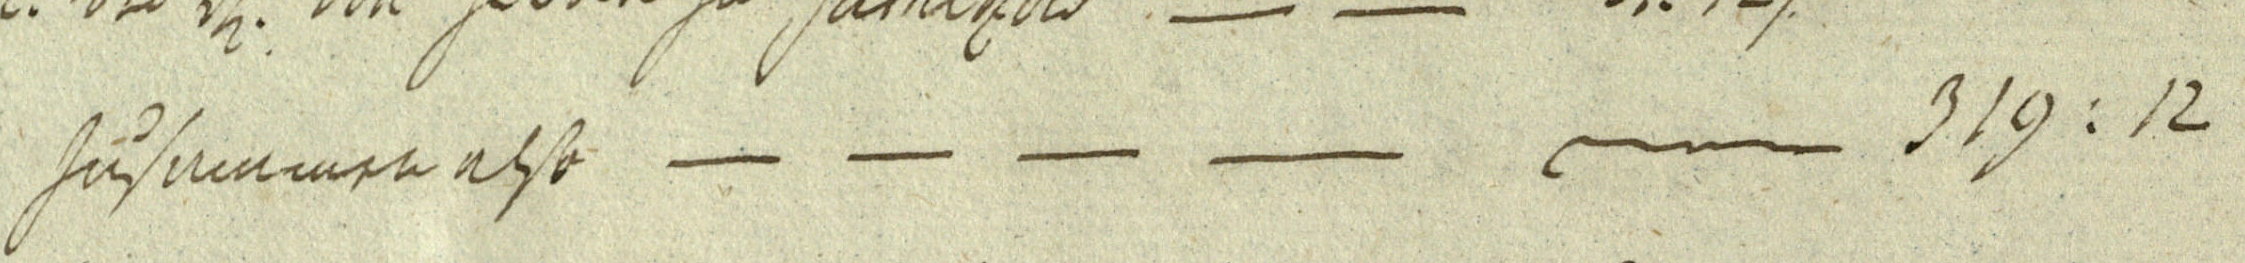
zusammen also 319 : 12
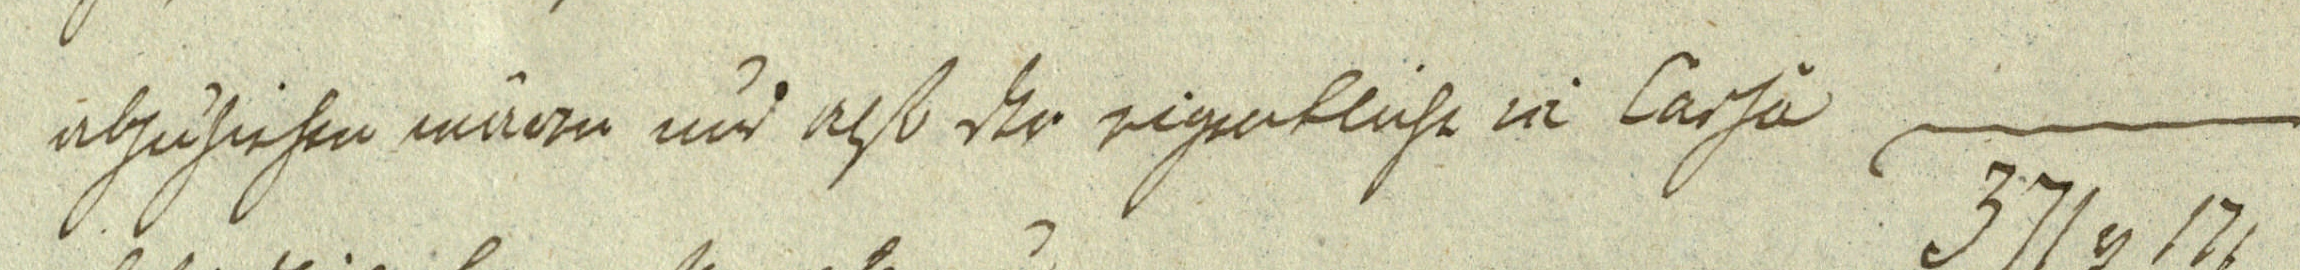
abzuhiehen wären und also der eigentliche in Cassa
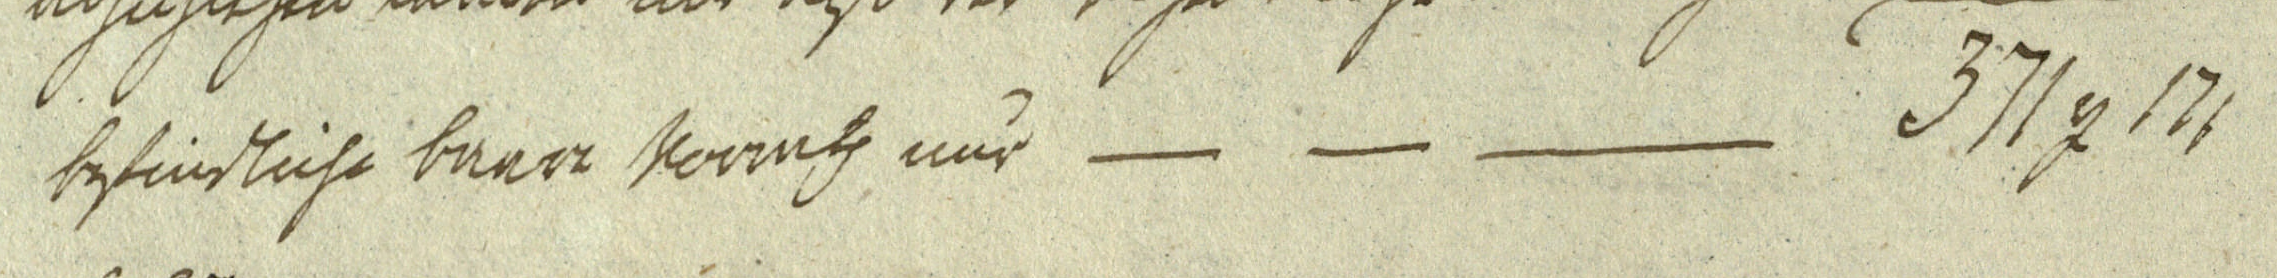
befindliche baare Vorrath nur 371 rt 17 s
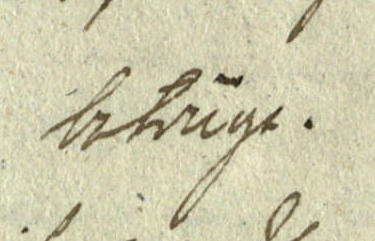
betrüge.
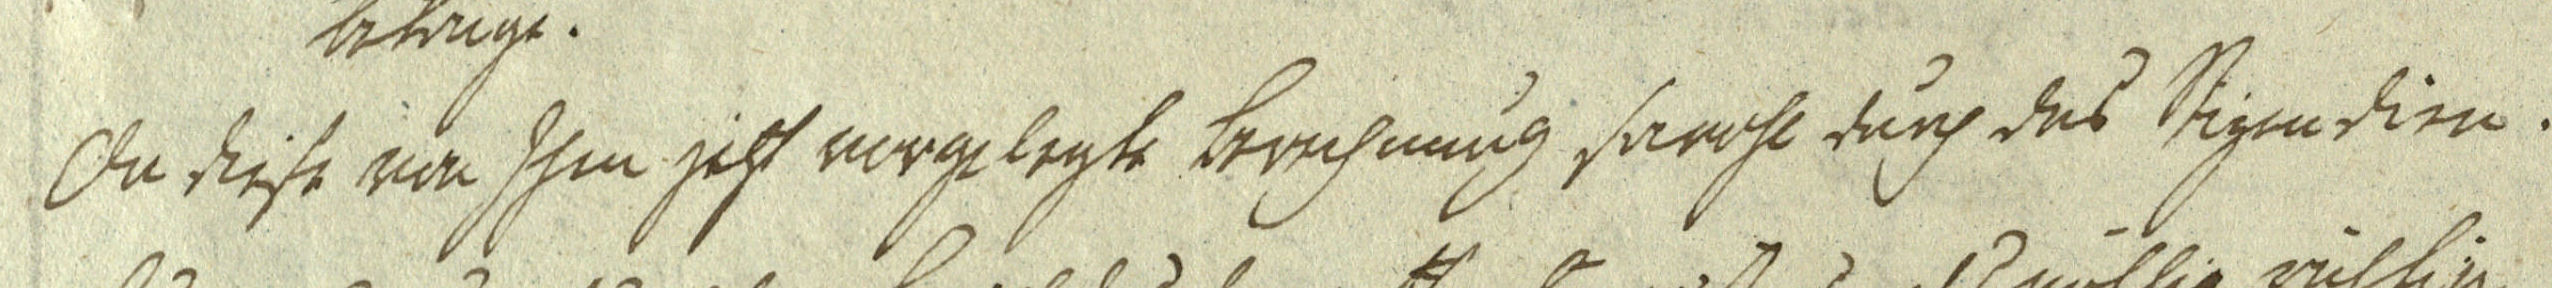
Da diese von Ihm jezt vorgelegte Berechnung sowohl durch das Stipendien¬
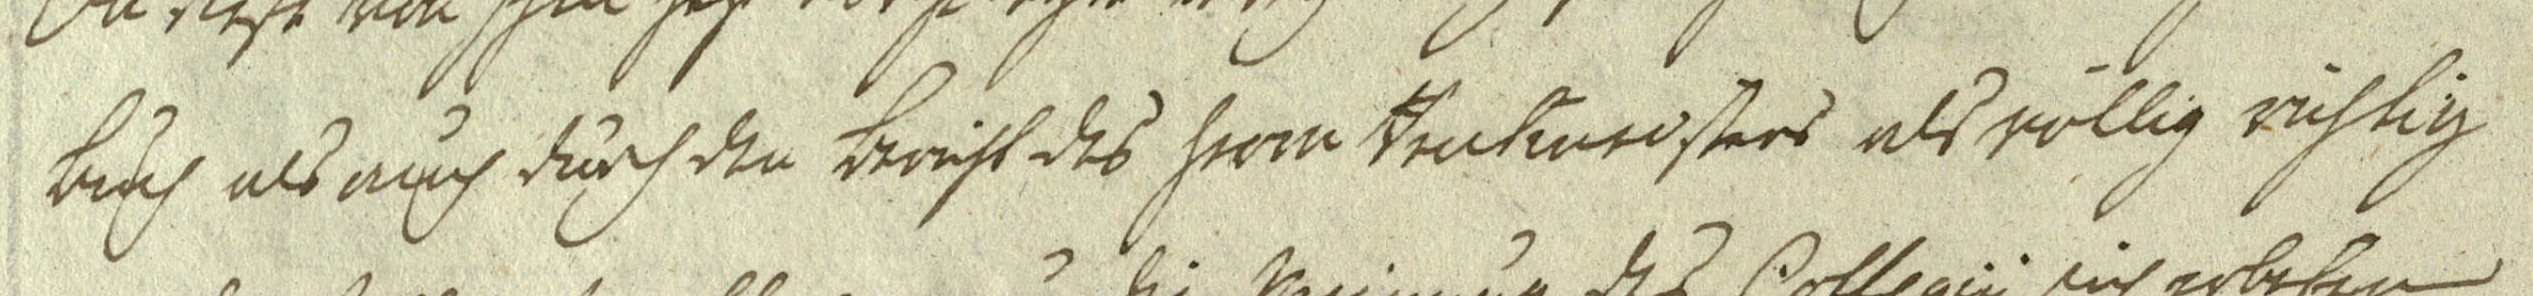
Buch als auch durch den Bericht des Herrn Rentmeisters als völlig richtig
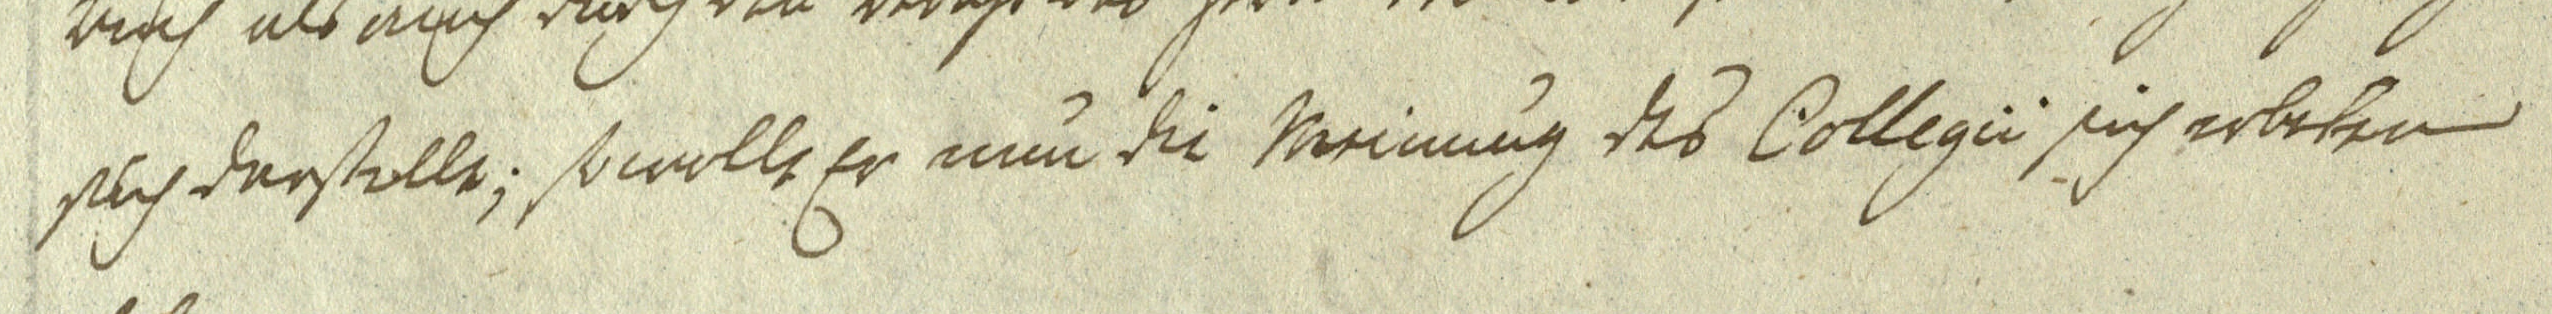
sich darstelle, so wolle Er nun die Meinung des Collegii sich erbeten
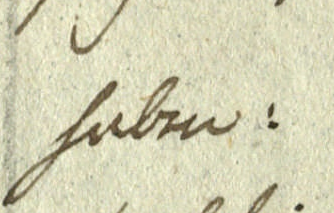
haben:
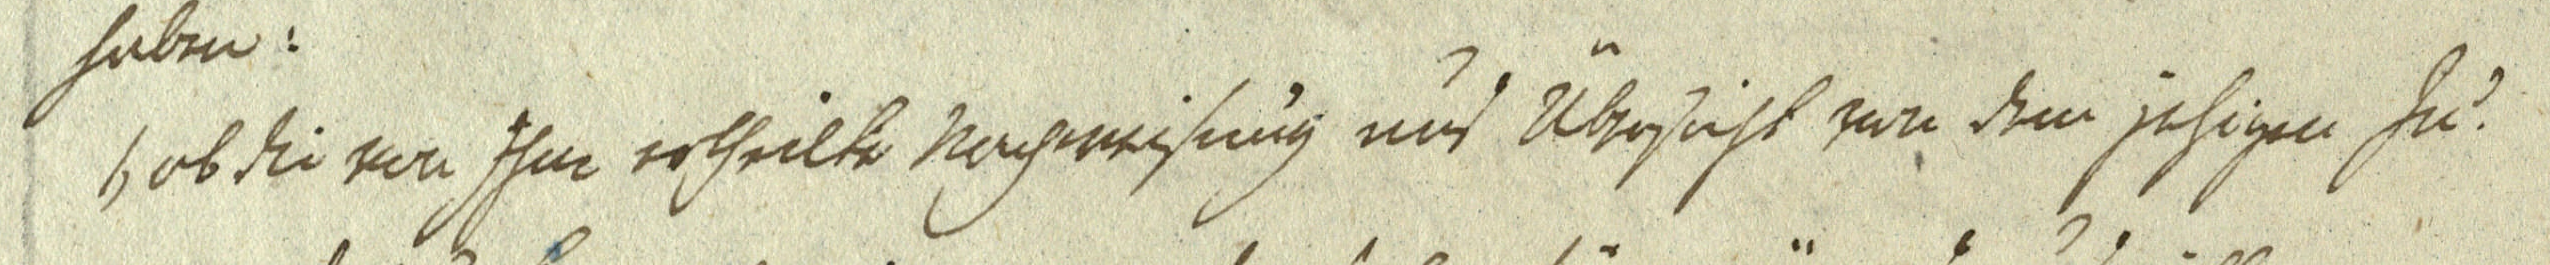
1, ob die von Ihm ertheilte Nachweisung und Übersicht von dem jetzigen Zu¬
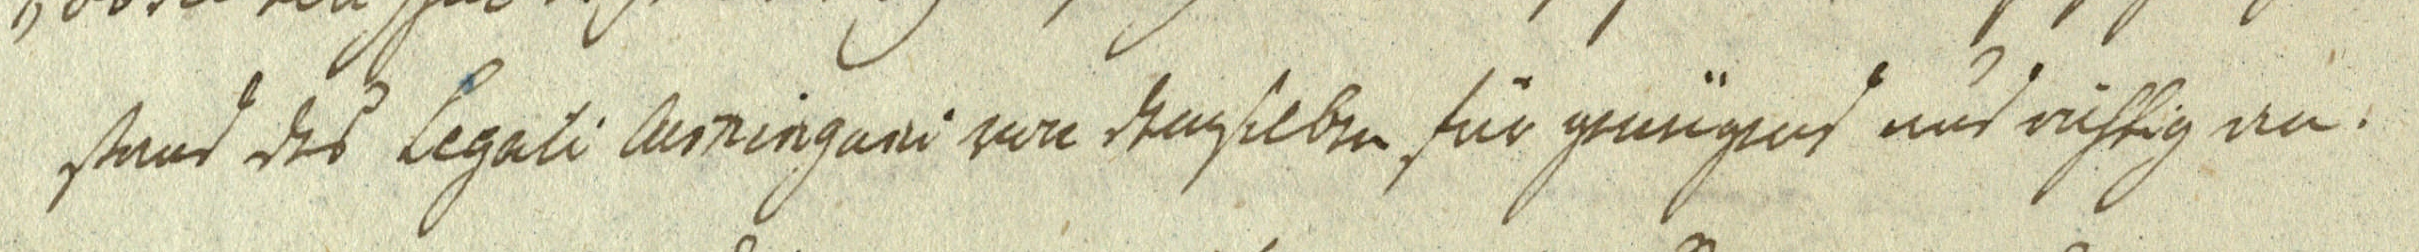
stand des Legati Aemingani von demselben für genügend und richtig an¬
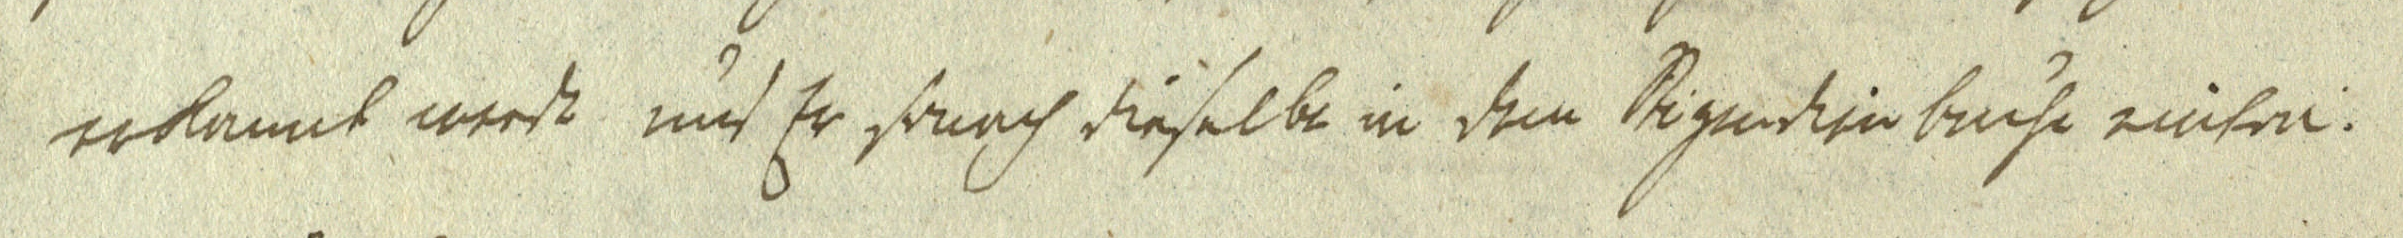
erkannt werde und Er sonach dieselbe in dem Stipendienbuche eintra¬
